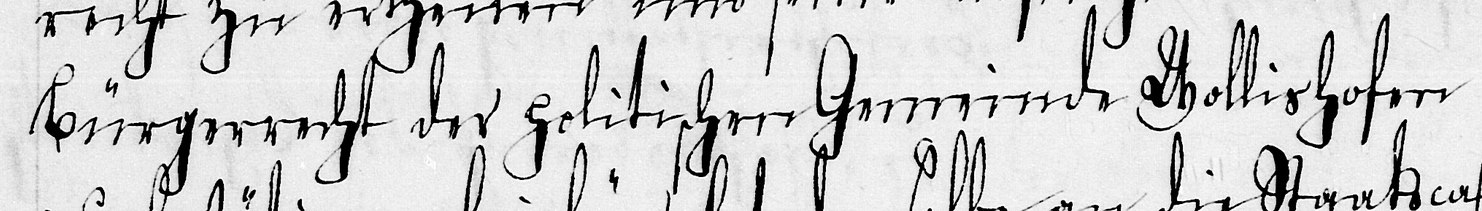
Bürgerrecht der politischen Gemeinde Wollishofen
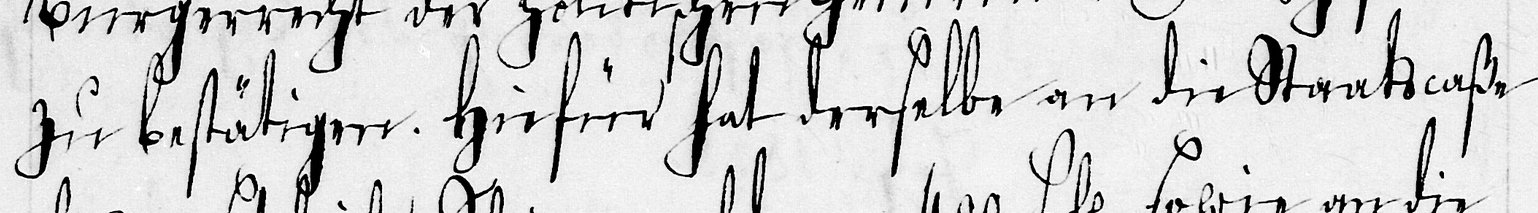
zu bestätigen. Hiefür hat derselbe an die Staatscaße
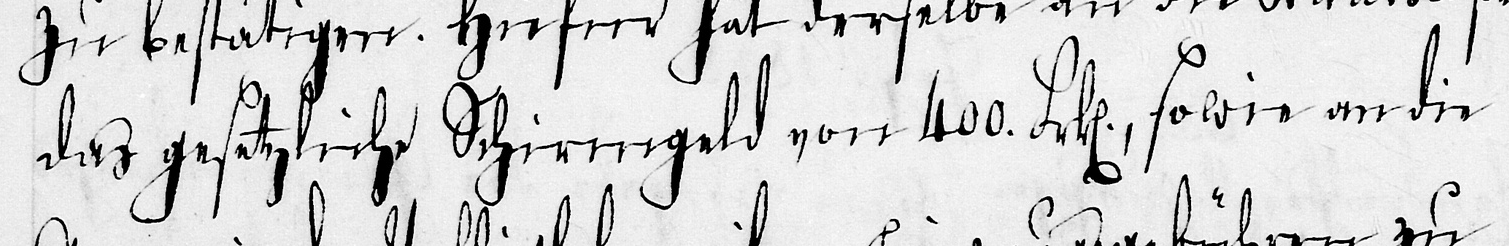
das gesetzliche Schirmgeld von 400. Frk[en]., sowie
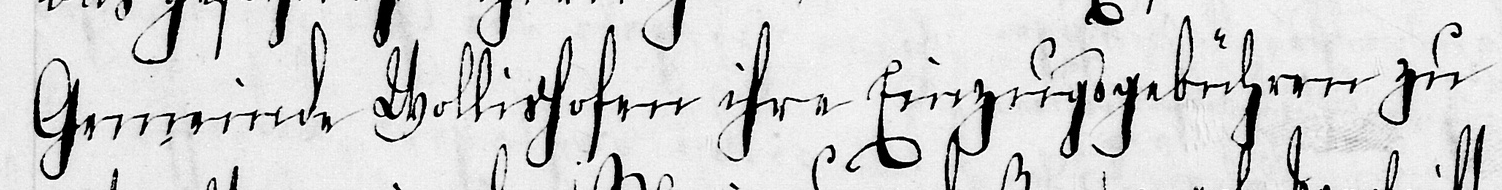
Gemeinde Wollishofen ihre Einzugsgebühren zu
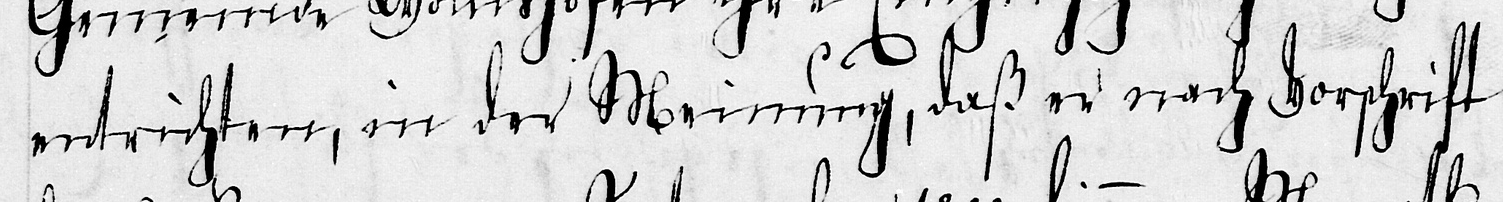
entrichten, in der Meinung, daß er nach Vorschrift
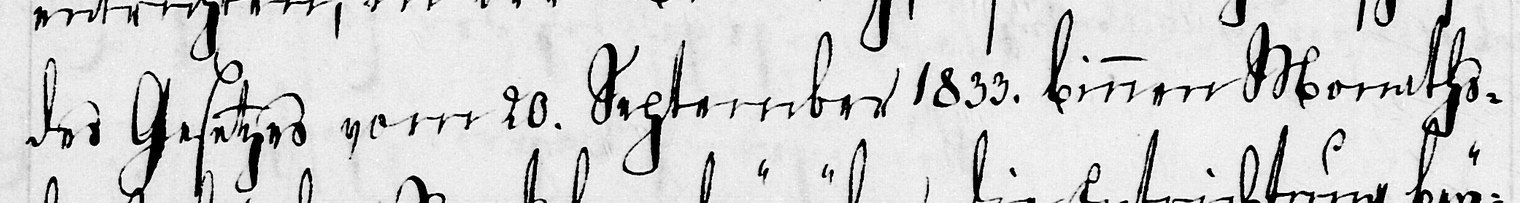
des Gesetzes vom 20. September 1833. binnen Monaths¬
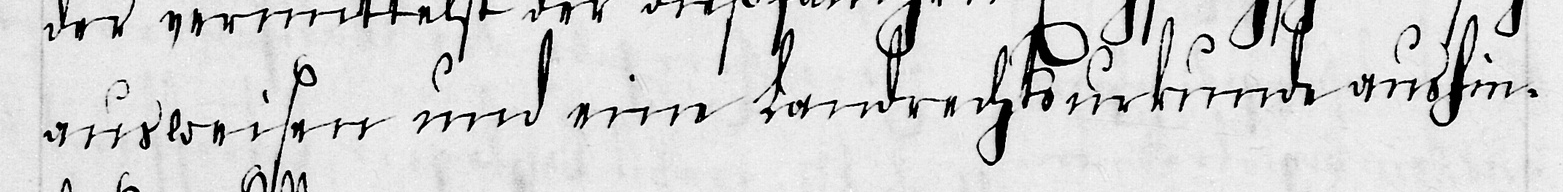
ausweisen und eine Landrechtsurkunde aushin¬
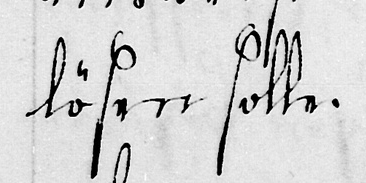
lösen soll¬
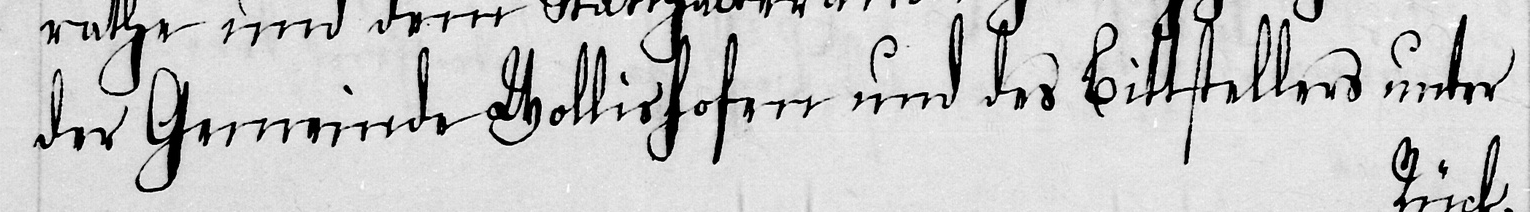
der Gemeinde Wollishofen und des Bittstellers unter
